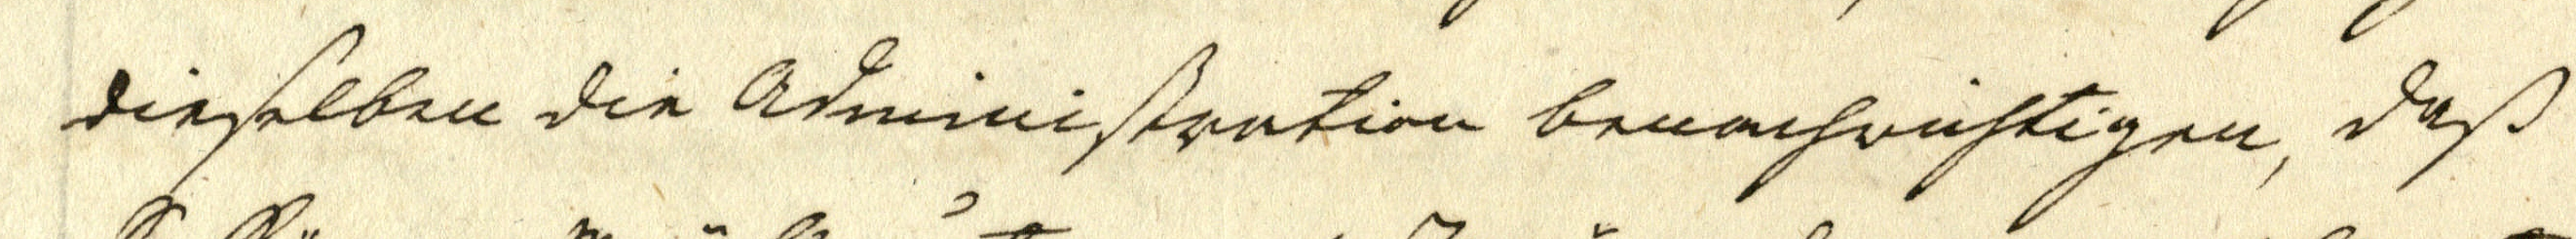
dieselben die Administration benachrichtigen, daß
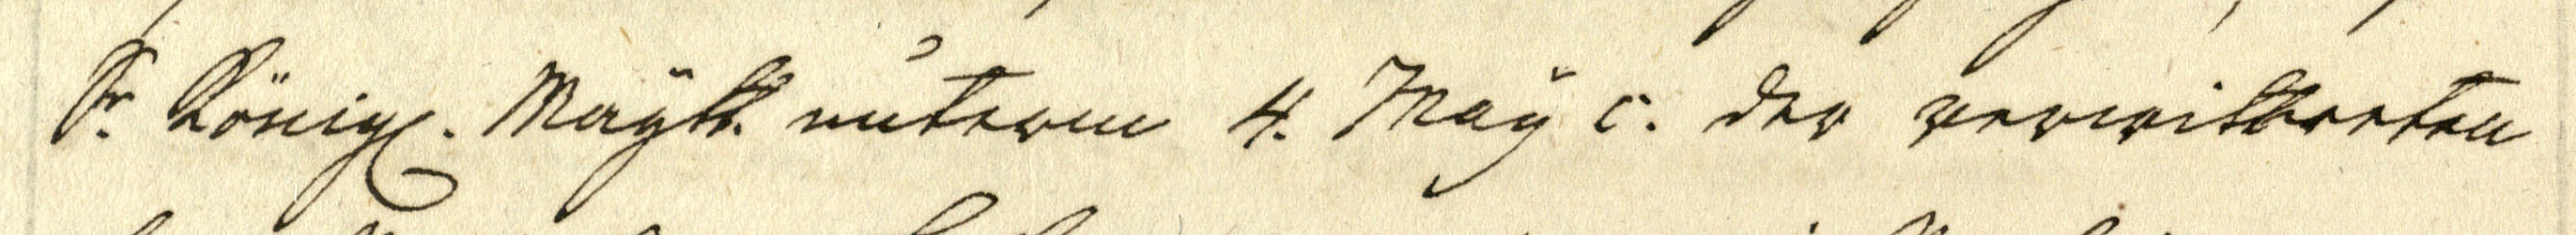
Sr. Königl. Maÿtt. unterm 4. Maÿ c. der verwittweten
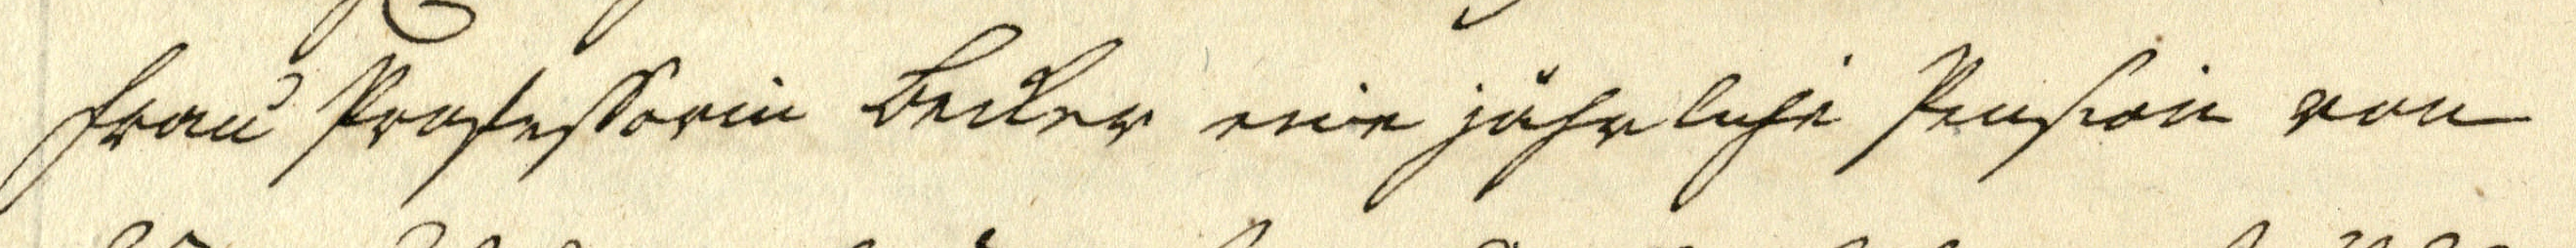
Frau Professorin Becker eine jährliche Pension von
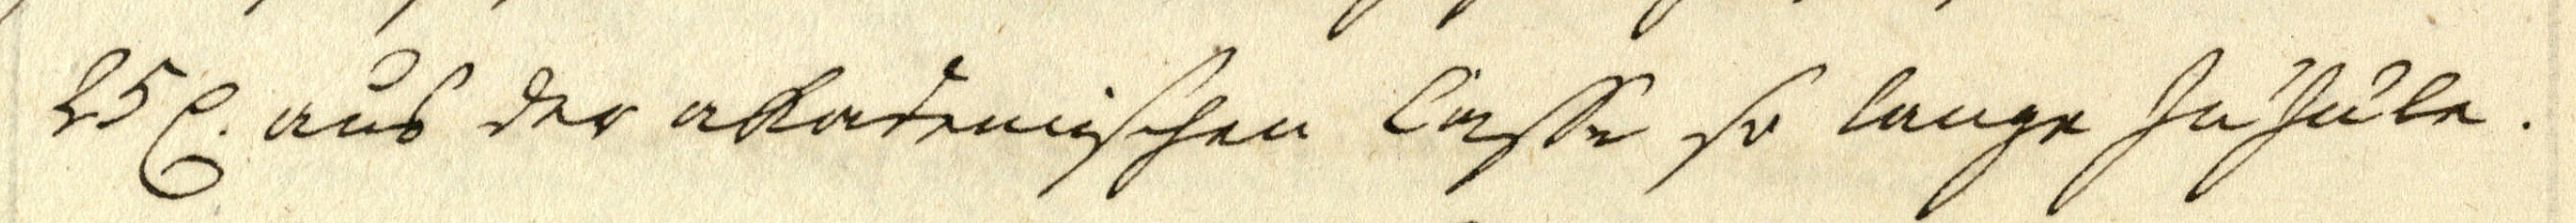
25 l. aus der akademischen Casse so lange zuzule¬
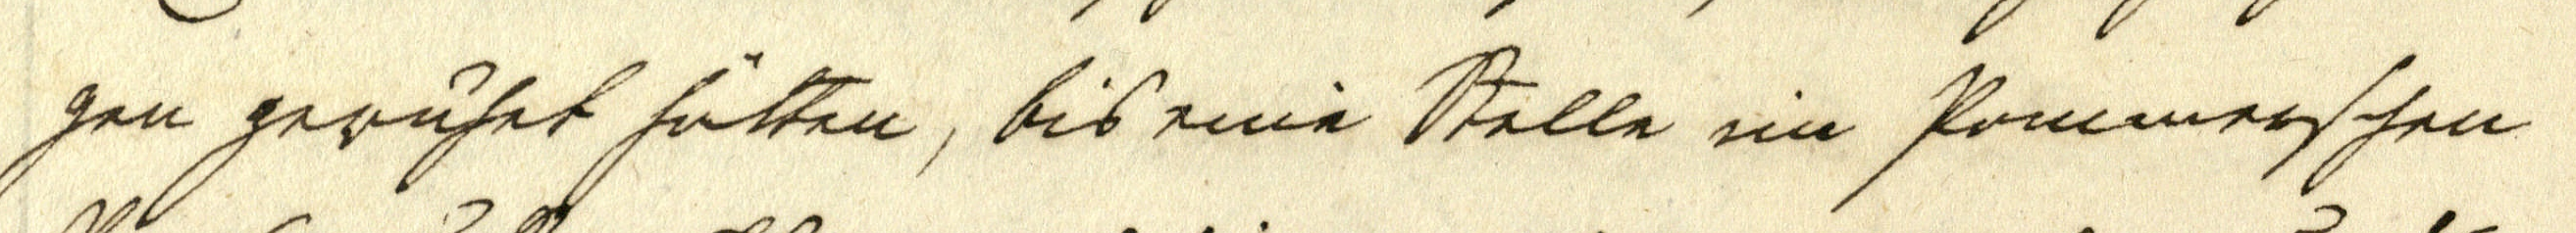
gen geruhet hätten, bis eine Stelle im Pommerschen
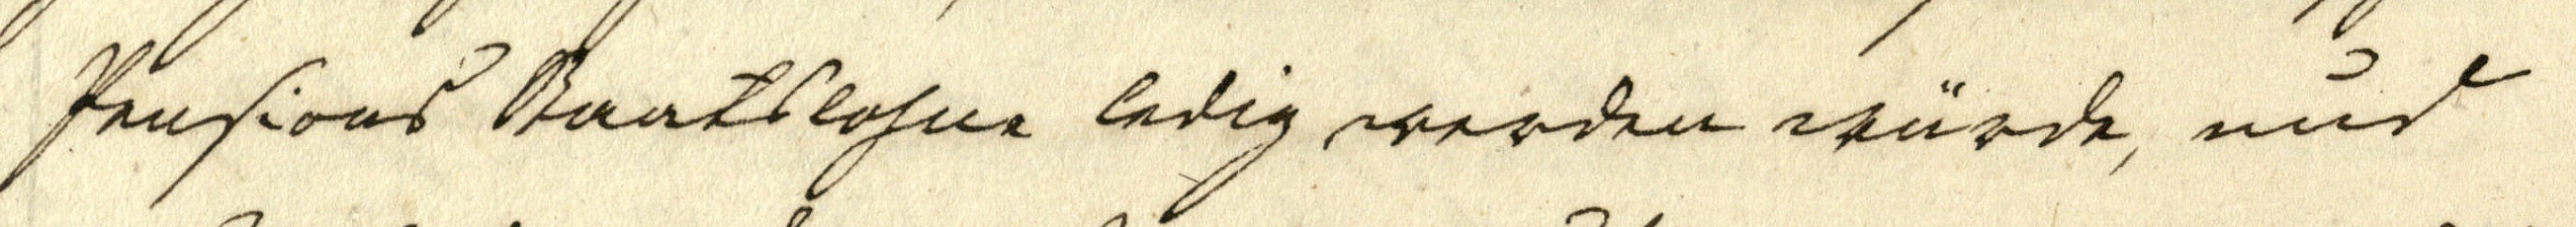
Pensions Staatslohne ledig werden würde, und
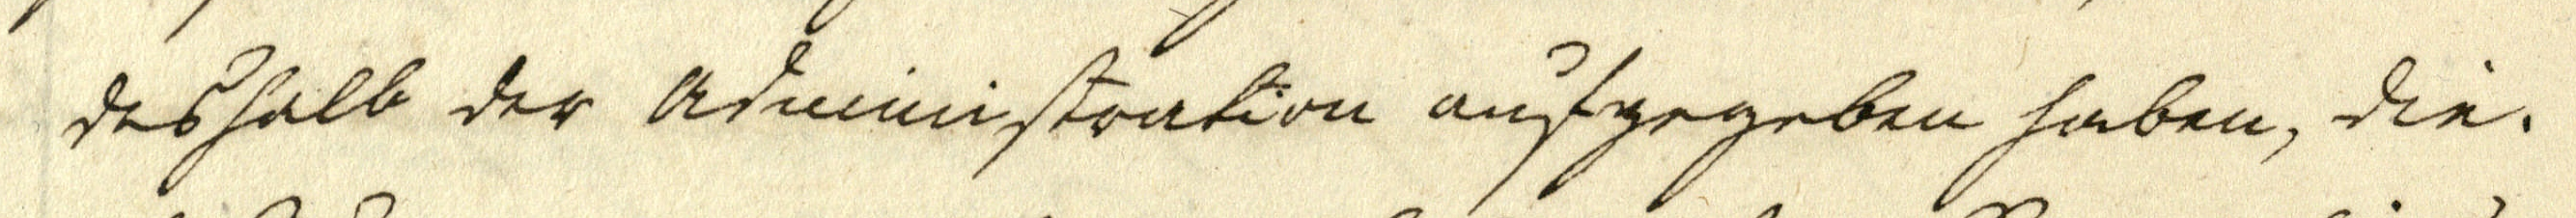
deshalb der Administration aufgegeben haben, die¬
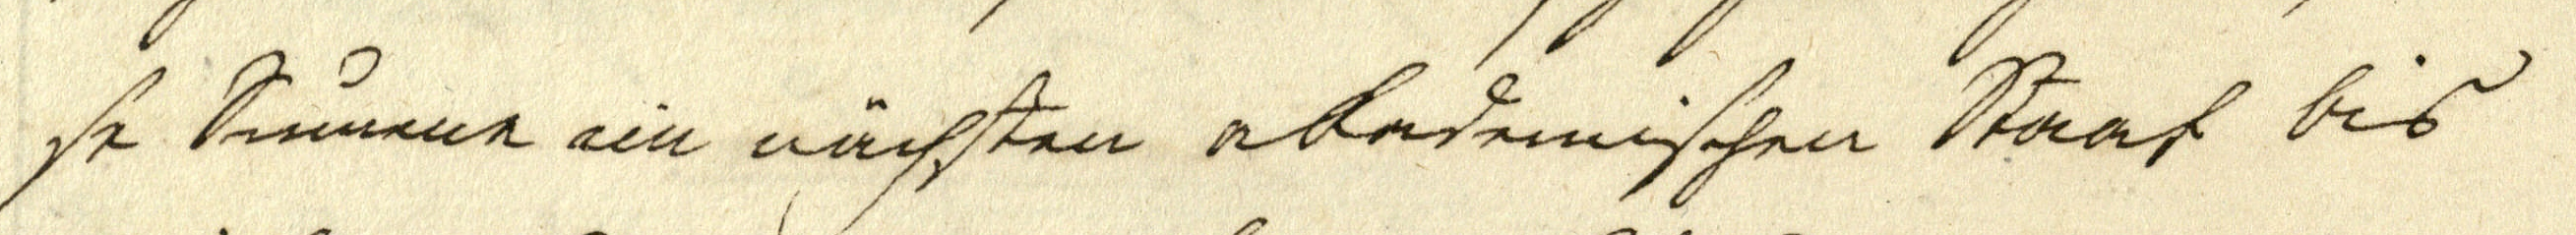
se Summe im nächsten akademischen Staat bis
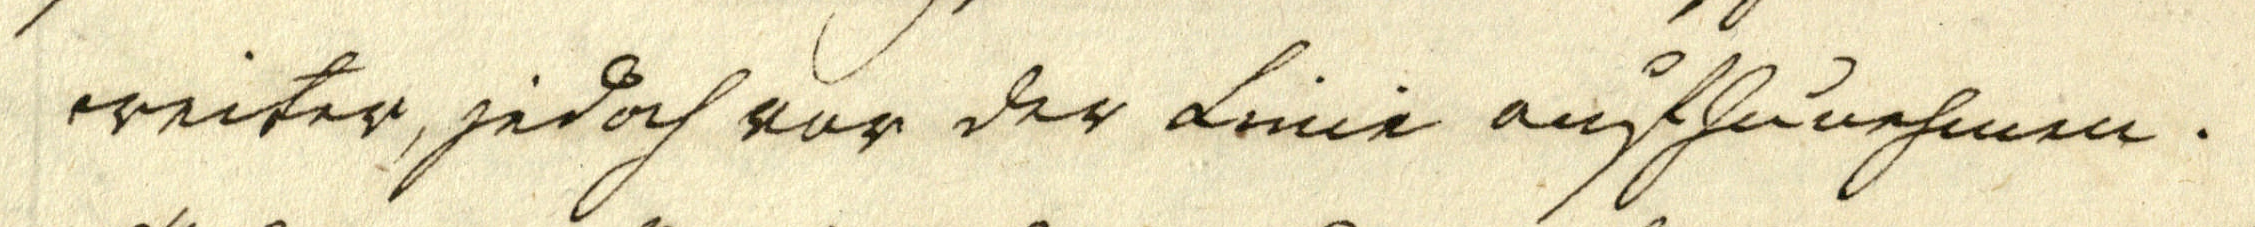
weiter, jedoch vor der Linie aufzunehmen.
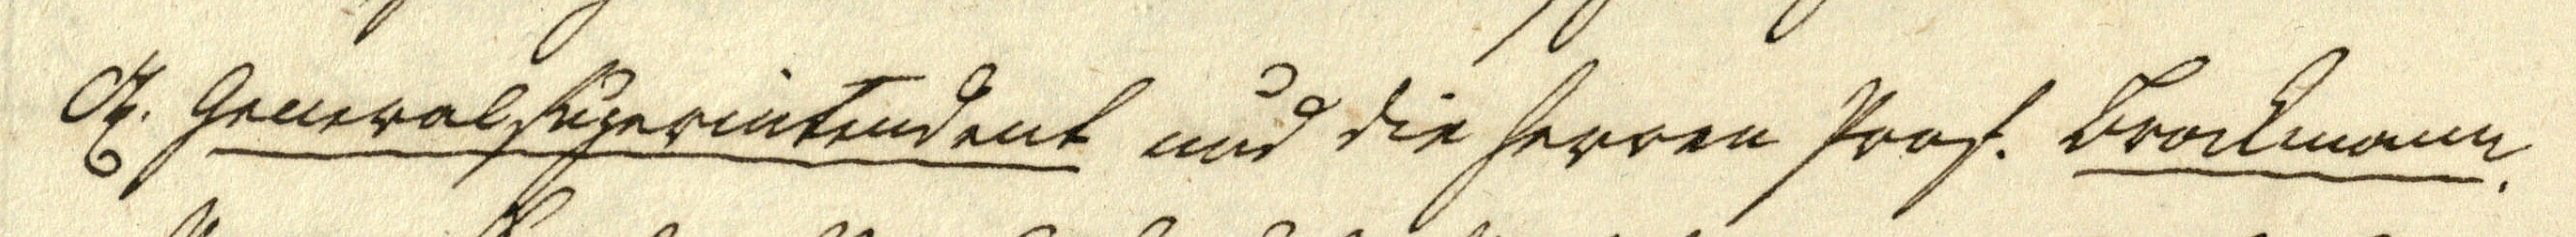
dh. Generalsuperintendent und die herren Prof. Brockmann,
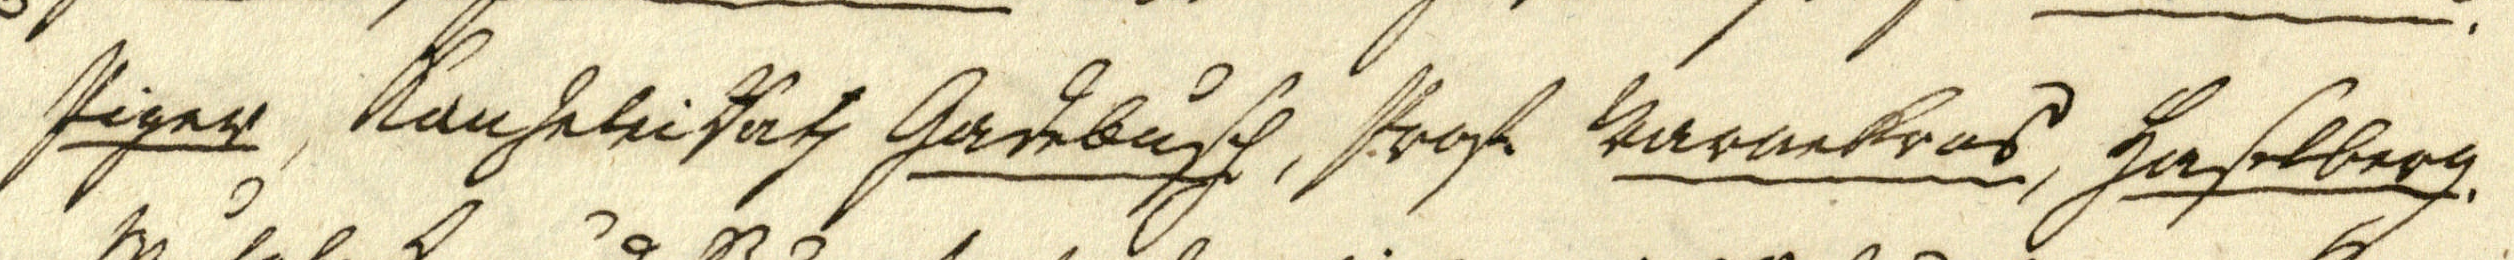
Piper, Kanzelei Rath Gadebusch,Prof. Warnekros, Haselberg,
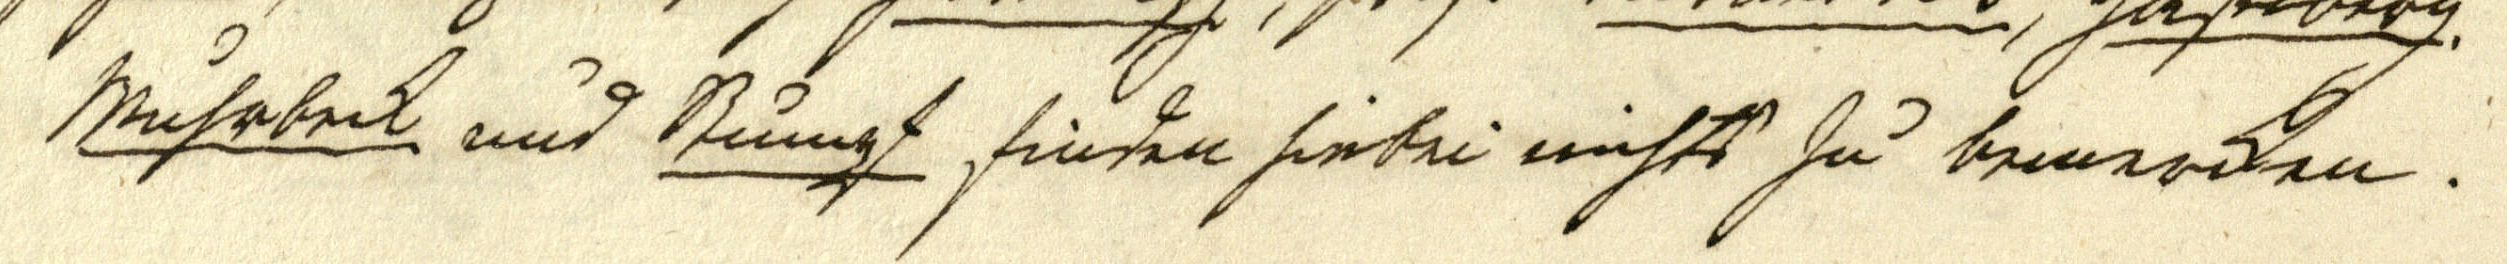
Muhrbeck und Stumpf finden hiebei nichts zu bemercken.
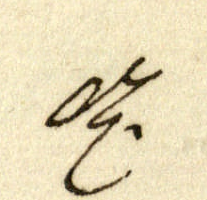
dh.
